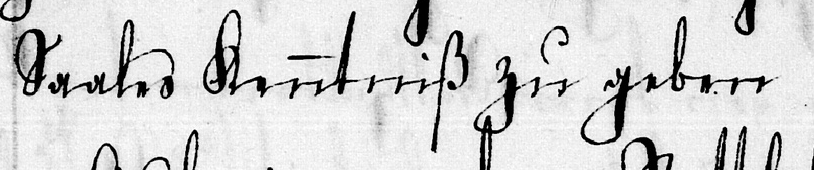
Saales Kenntniß zu geben.
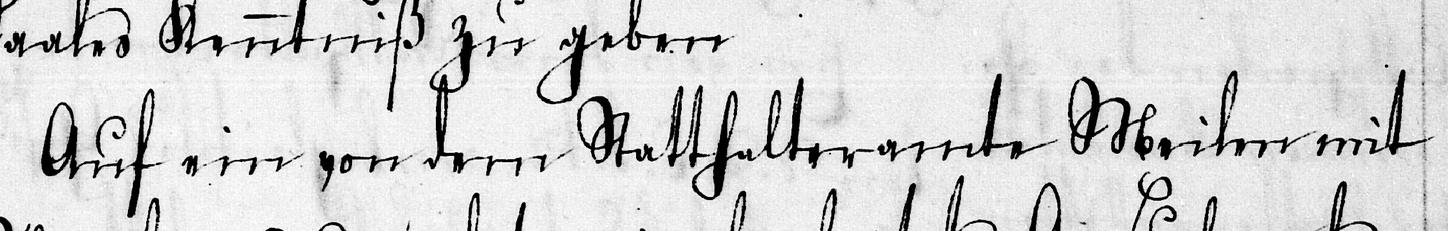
Auf ein von dem Statthalteramte Meilen mit
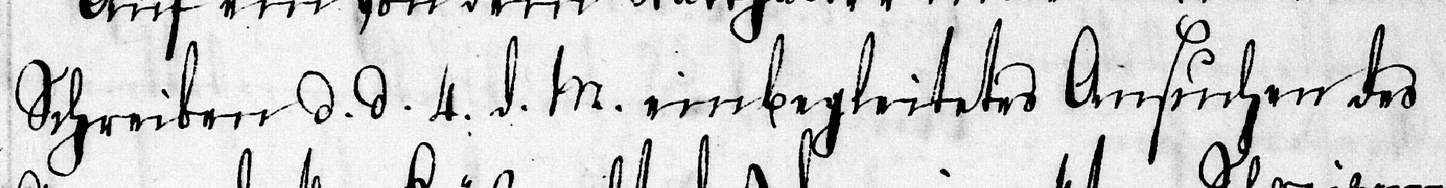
Schreiben d. d. 4. d. M. einbegleitetes Ansuchen des
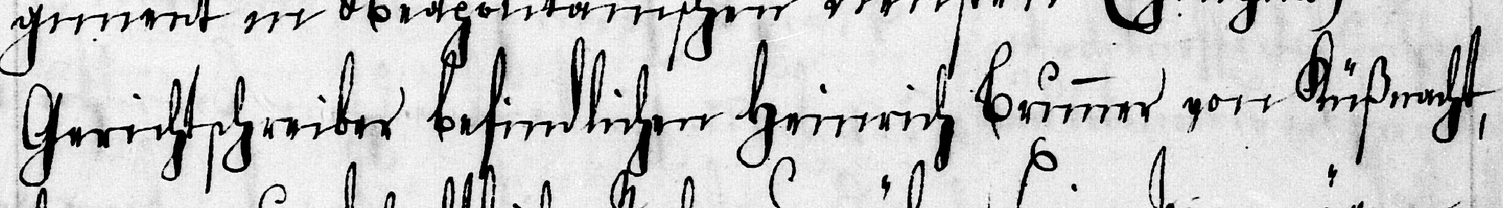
Gerichtschreiber befindlichen Heinrich Brunner von Küßnacht
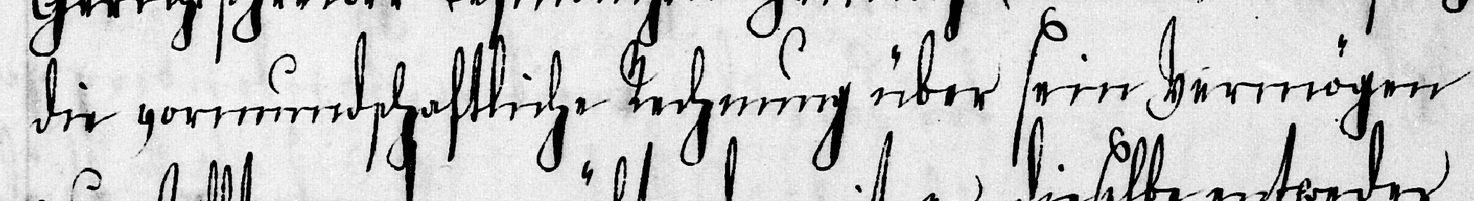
die vormundschaftliche Rechnung über sein Vermögen
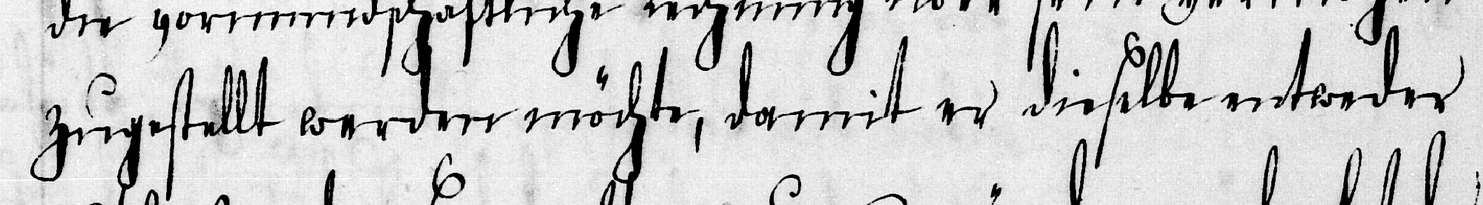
zugestellt werden möchte, damit er dieselbe entweder
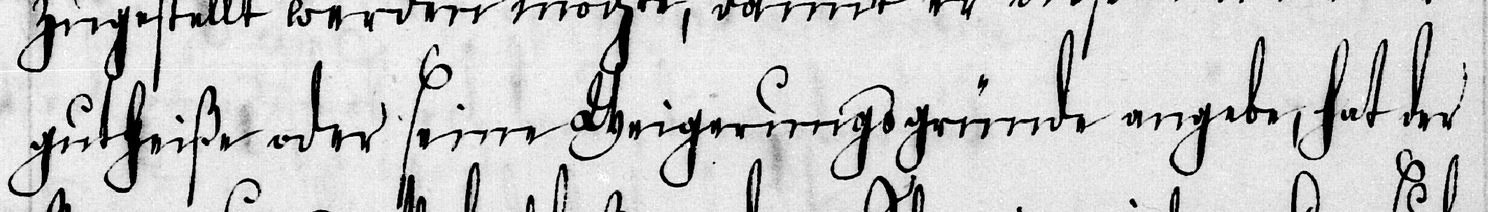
gutheiße oder seine Weigerungsgründe angebe, hat der
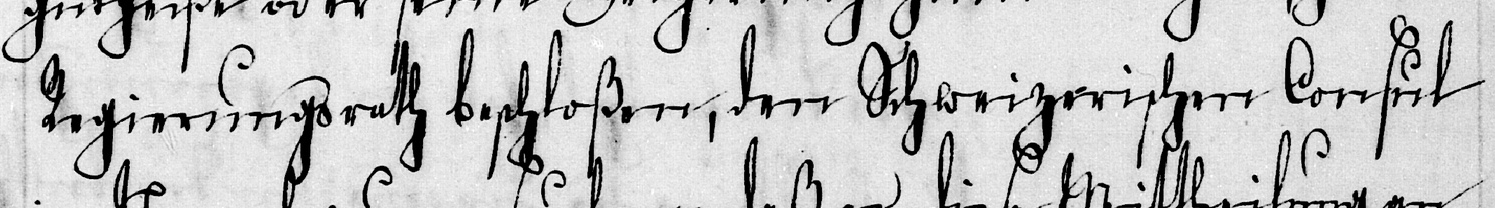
Regierungsrath beschloßen, den Schweizerischen Consul
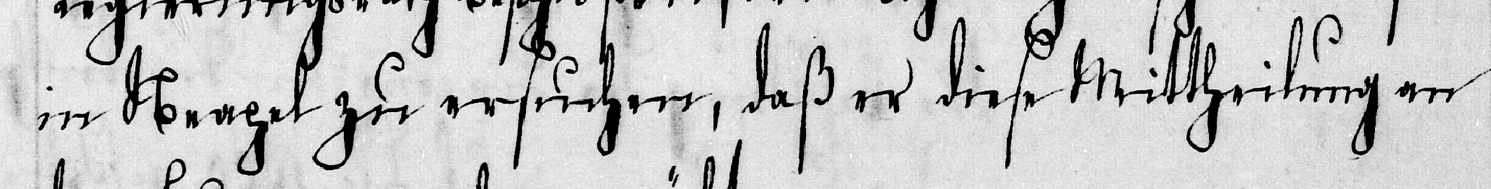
in Neapel zu ersuchen, daß er diese Mittheilung an
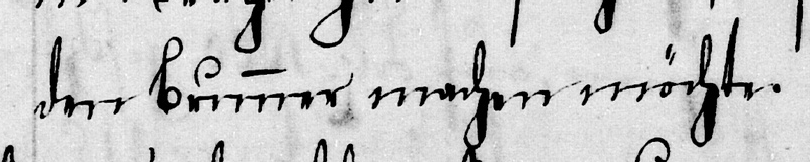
den Brunner machen möchte.
